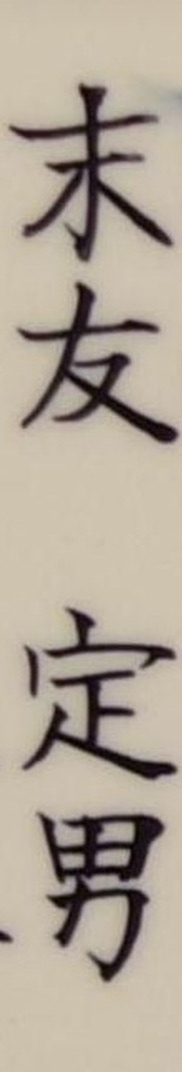末友定男
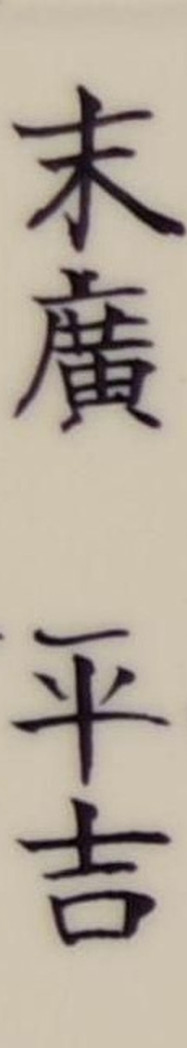末廣平吉
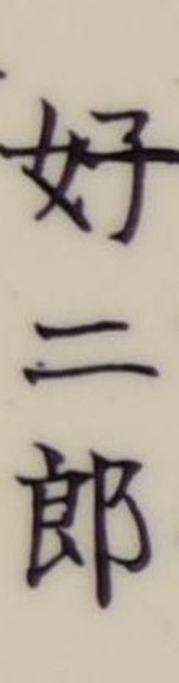好二郎
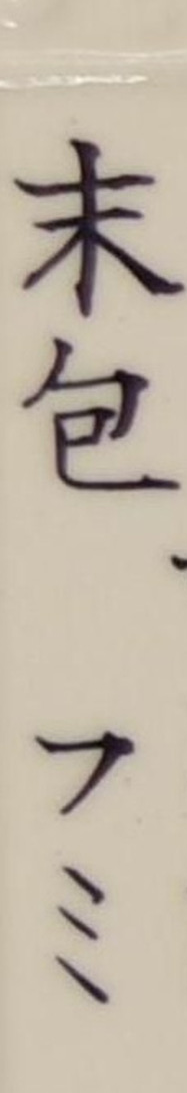末包フミ

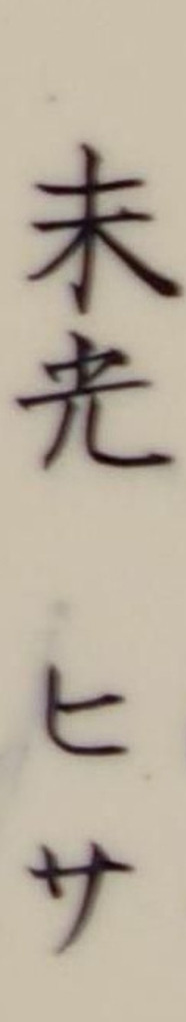未光ヒサ
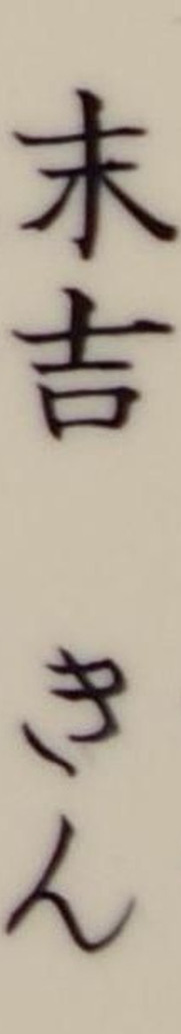末吉きん
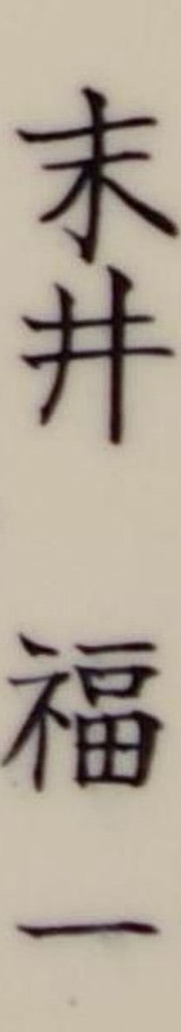末井福一
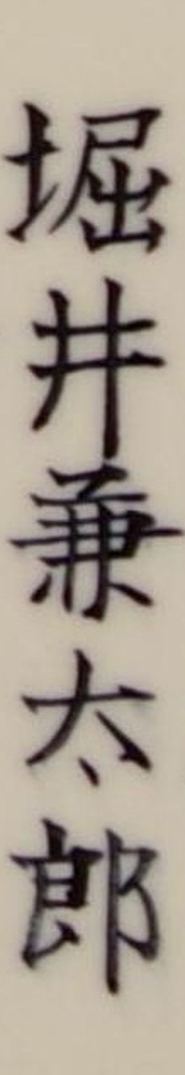堀井兼太郎
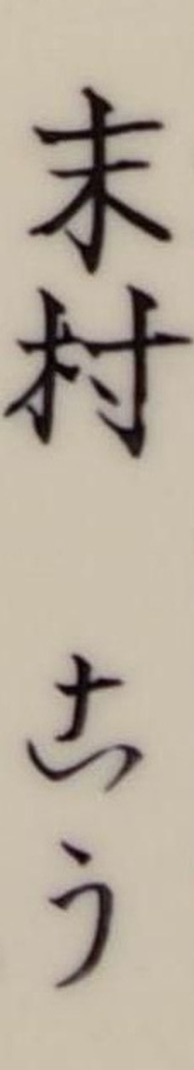末村こう
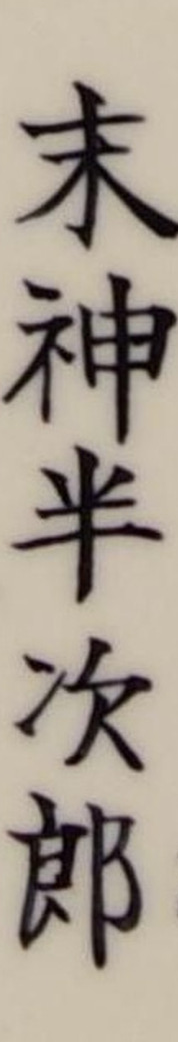未神半次郎
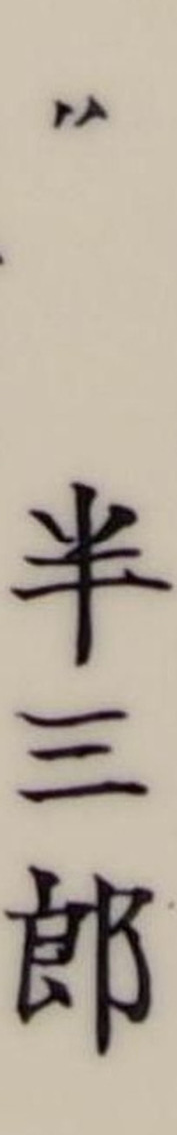半三郎
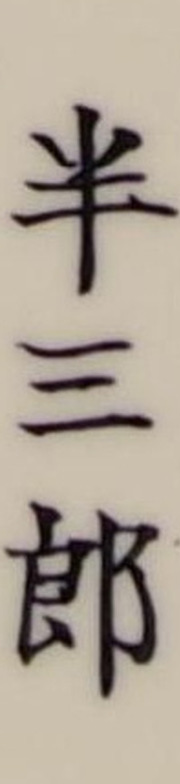半三郎
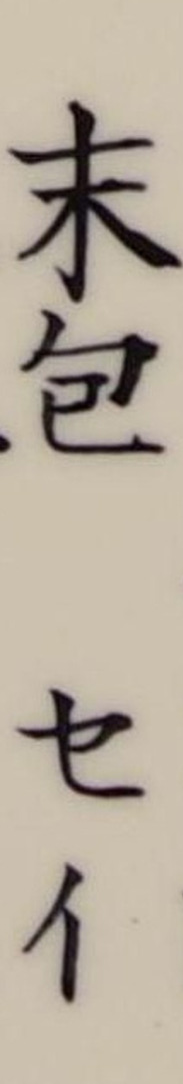末包セイ
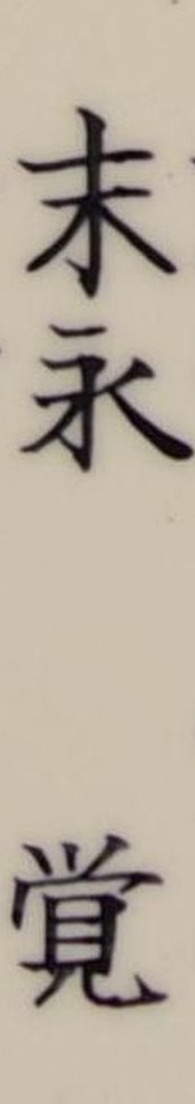未永覚
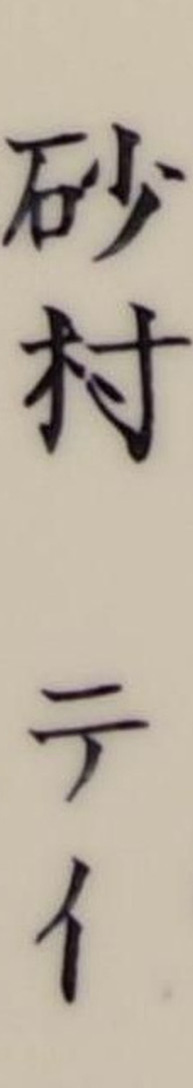砂村テイ
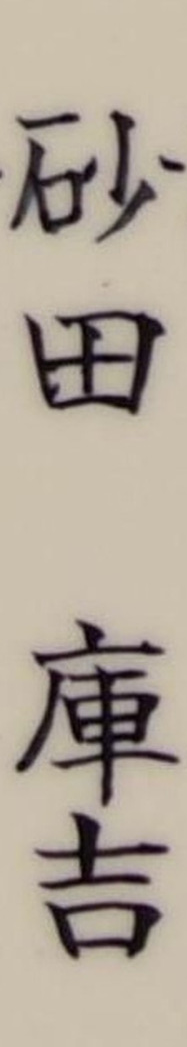砂田庫吉
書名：M~S
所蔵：高野山金剛峯寺
